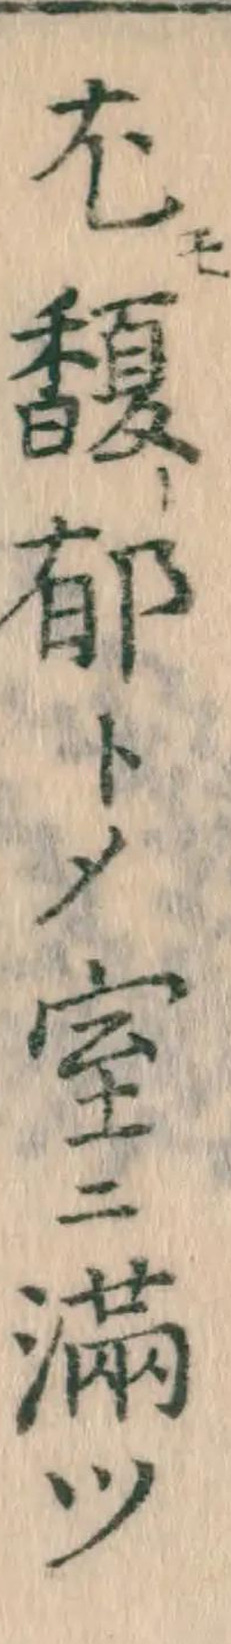尤馥-郁トシテ室ニ満ツ
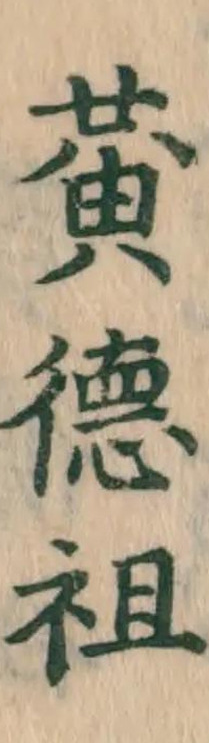黄徳祖

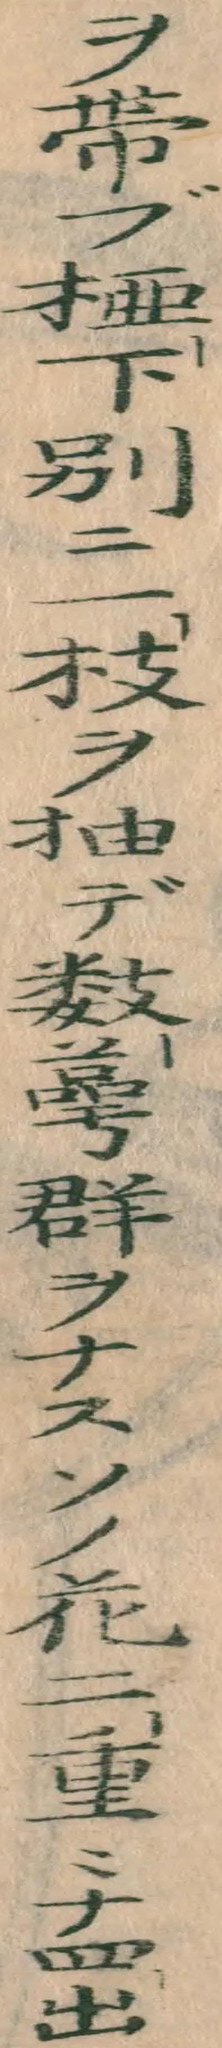ヲ帯ブ椏-下別ニ一-枝ヲ抽デ数-萼群ヲナスソノ花二-重ナ四-出
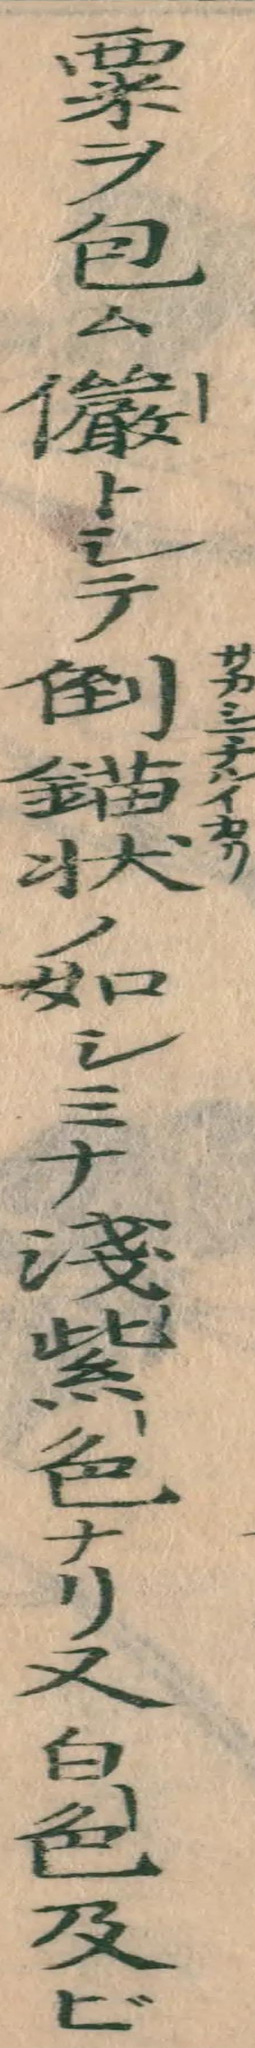粟ヲ包ム儼トシテ倒錨状ノ如シミナ浅-紫-色ナリ又白-色及ビ
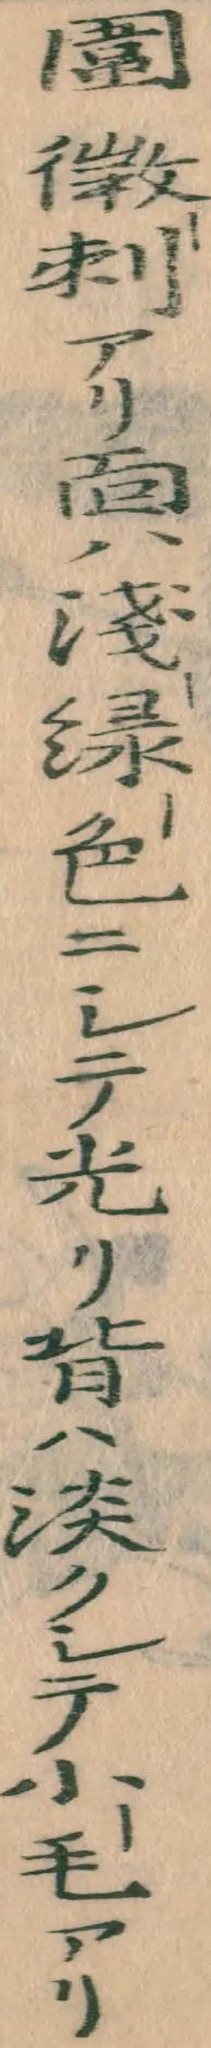囲微-刺アリ面ハ浅-緑-色ニシテ光リ背ハ淡クシテ小-毛アリ
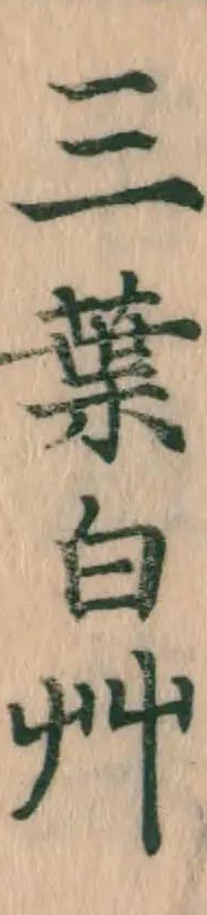三葉白艸

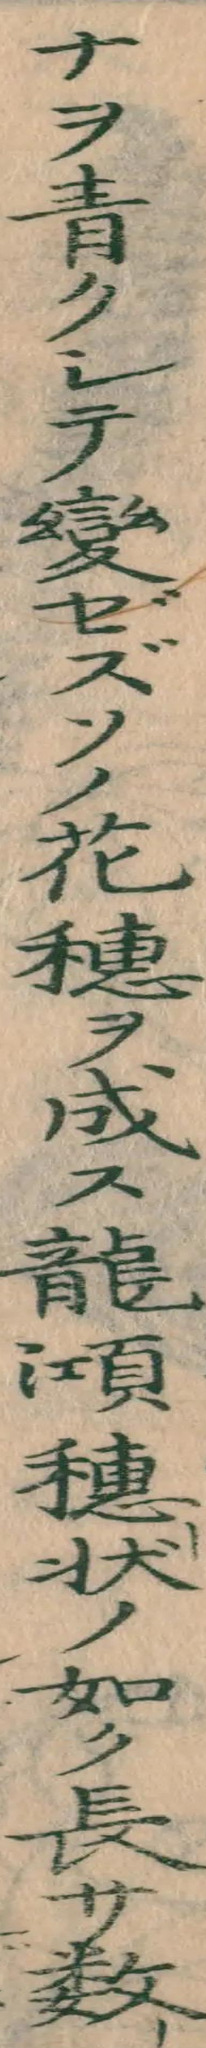ナヲ青クシテ変ゼズソノ花穂ヲ成ス竜澒穂-状ノ如ク長サ数-
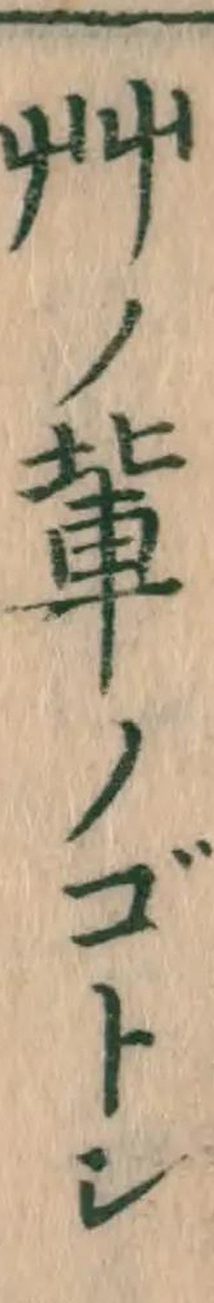艸ノ輩ノゴトシ
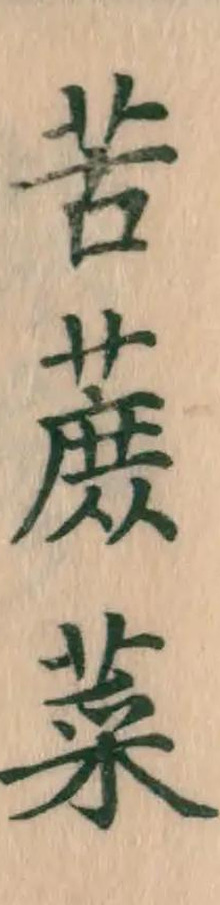苦蔗菜

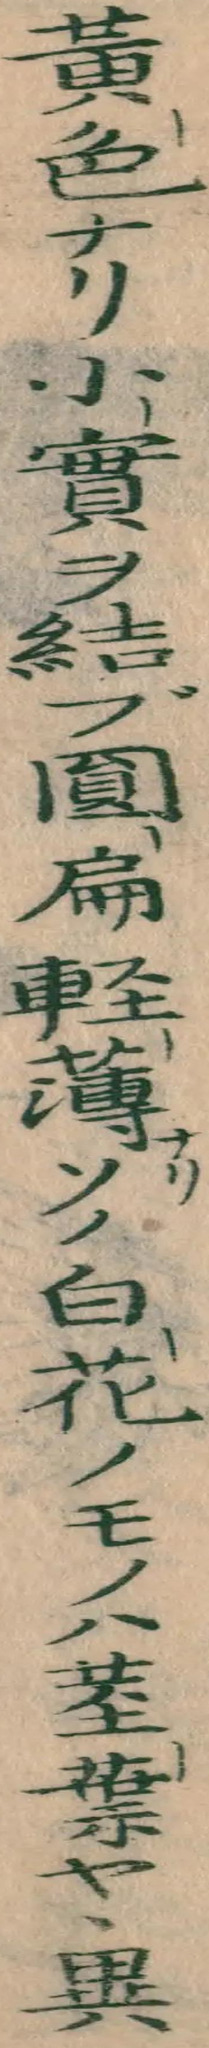黄-色ナリ小-実ヲ結ブ円-扁軽-薄ソノ白-花ノモノハ茎-葉ヤヽ異
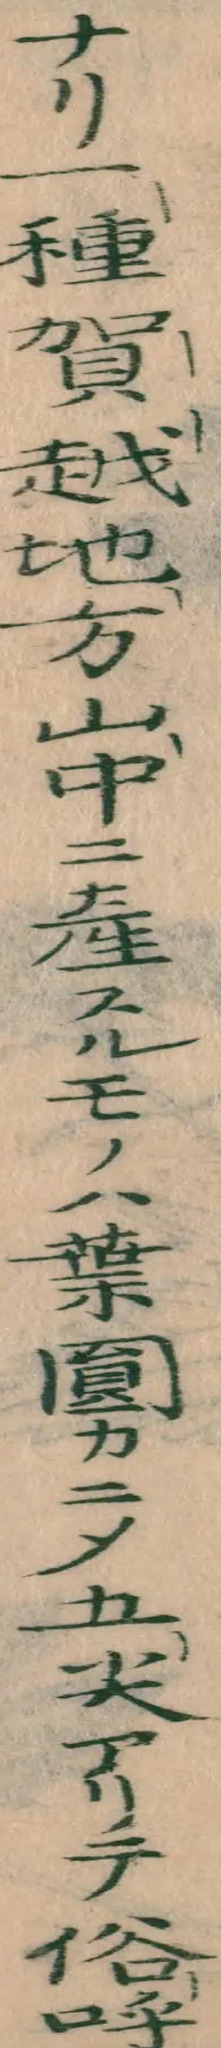ナリ一-種賀-越地-方山-中ニ産スルモノハ葉円カニシテ五-尖アリテ俗-呼

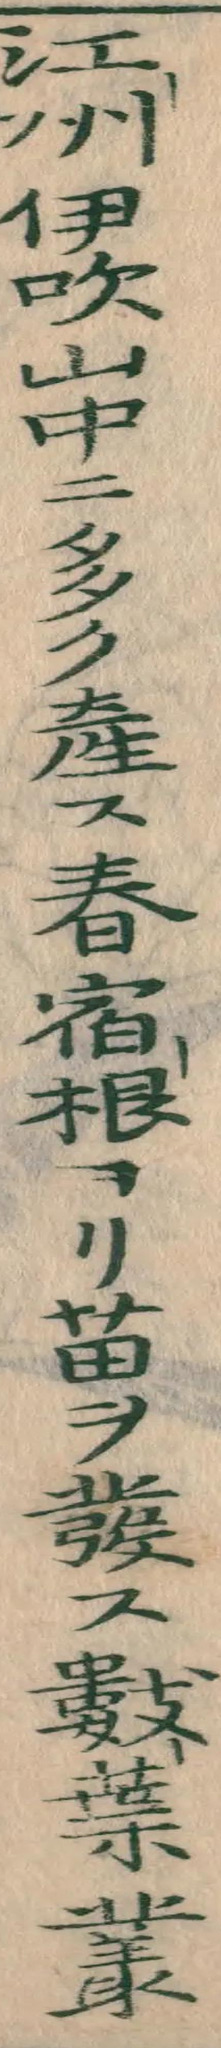江-州伊吹山中ニ多ク産ス春宿-根ヨリ苗ヲ発ス数-葉叢
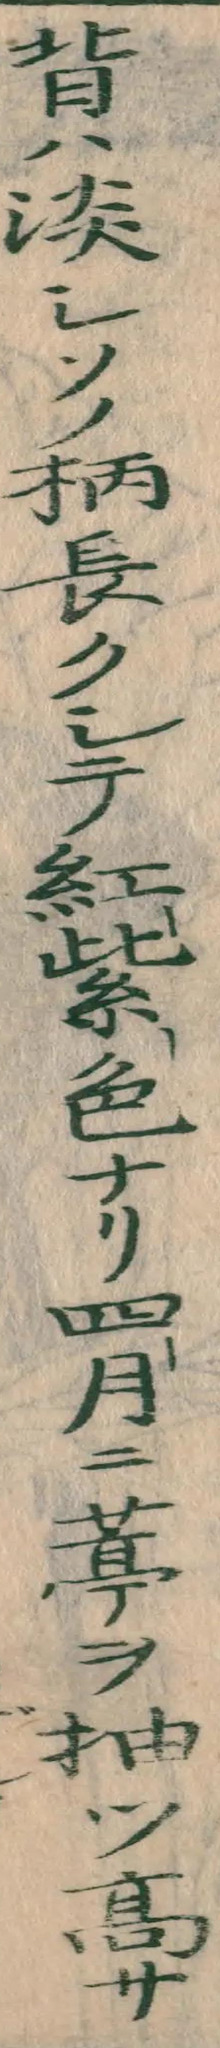背ハ淡シソノ柄長クシテ紅-紫-色ナリ四-月ニ葶ヲ抽ツ高サ
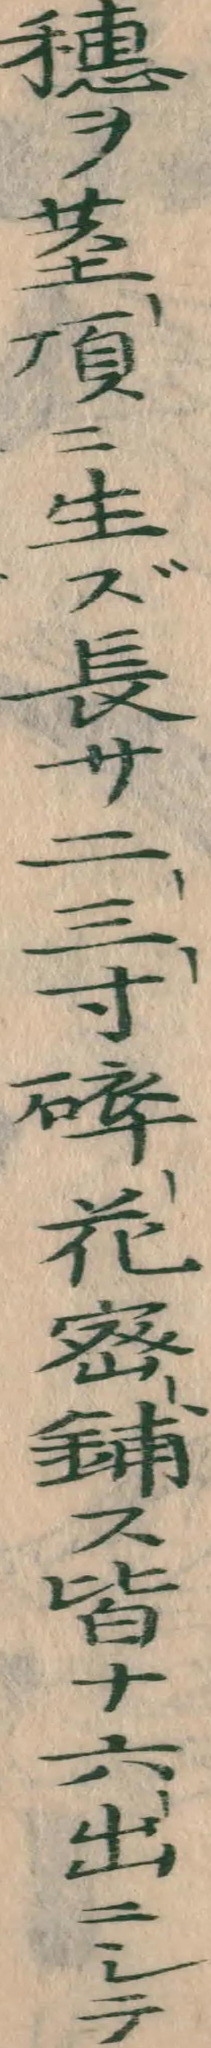穂ヲ茎-頂ニ生ズ長サ二-三-寸砕-花密-鋪ス皆ナ六-出ニシテ
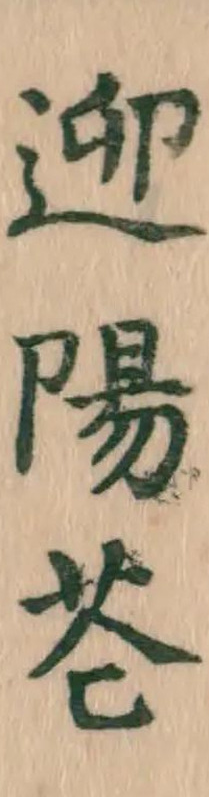迎陽花

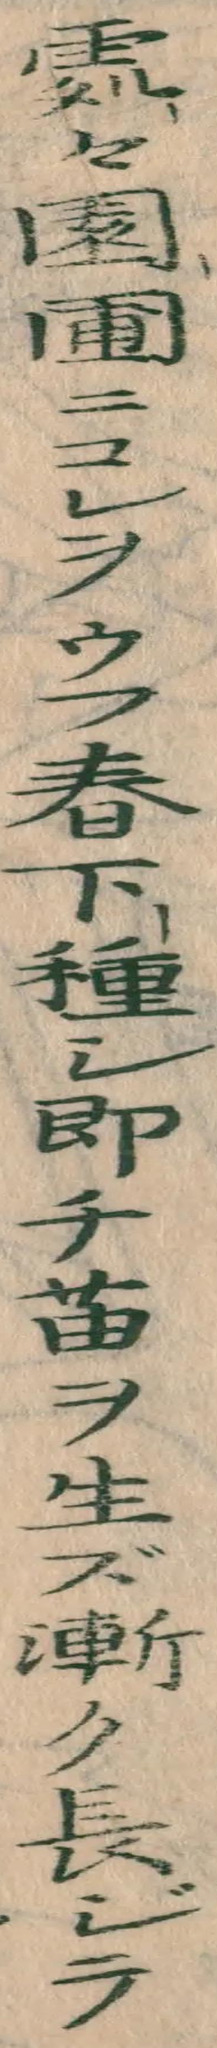処-々園-圃ニコレヲウフ春下-種シ即チ苗ヲ生ズ漸ク長ジテ
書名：花彙 草部4巻木部4巻. [1]
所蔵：国立国会図書館 National Diet Library, JAPAN
